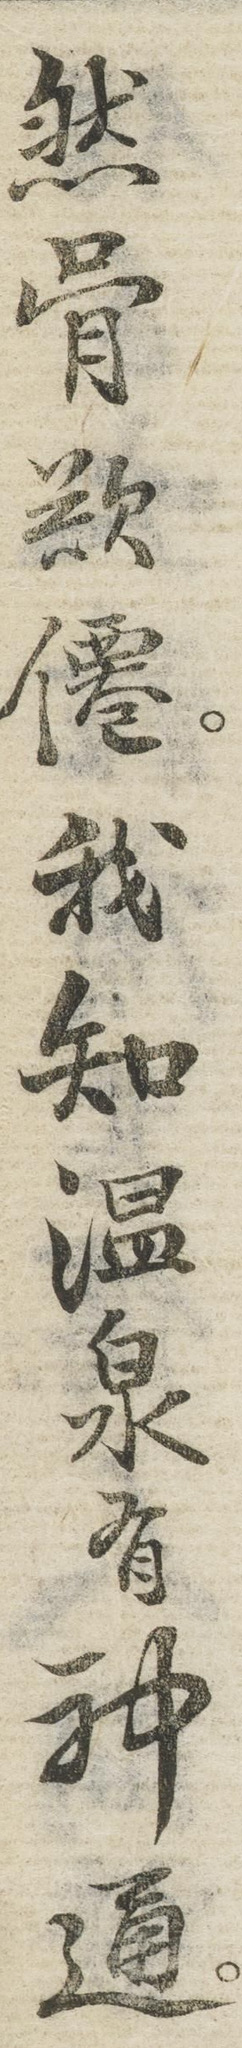然骨僊我知温泉有神通

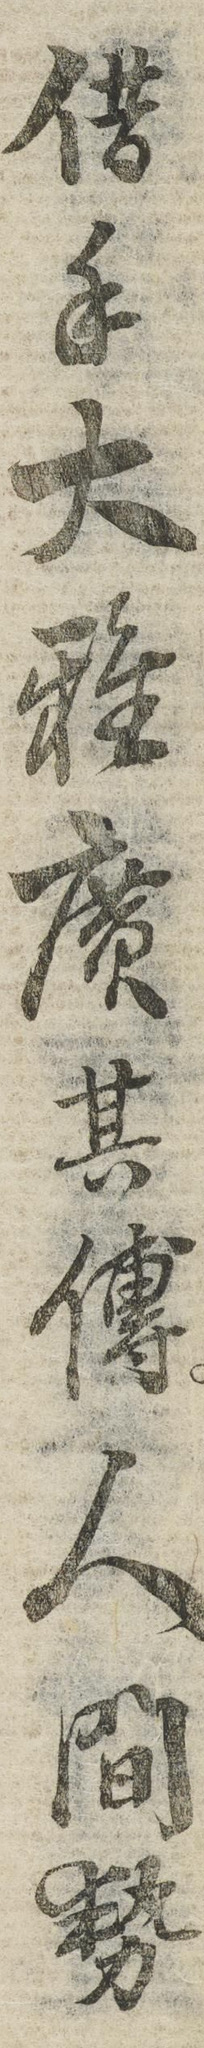借手大雅広其伝人間勢
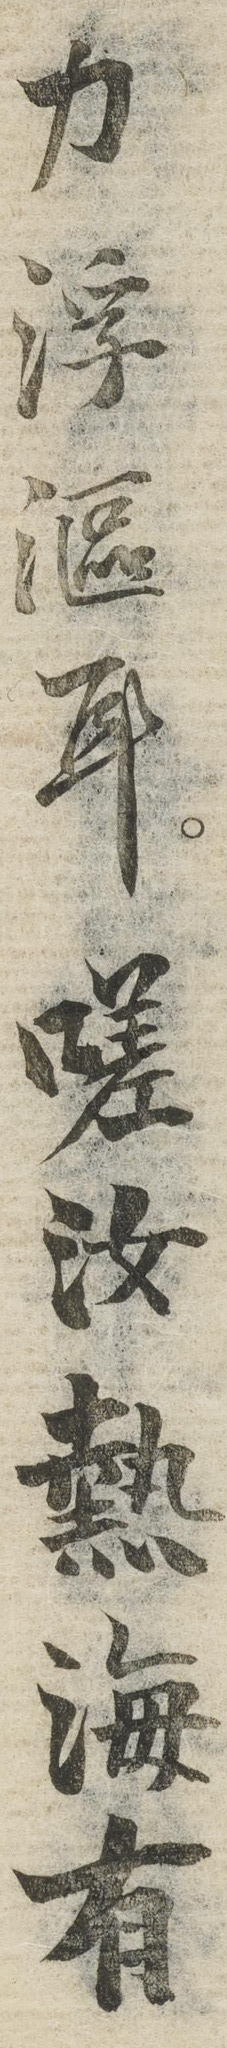力浮漚耳嗟汝熱海有
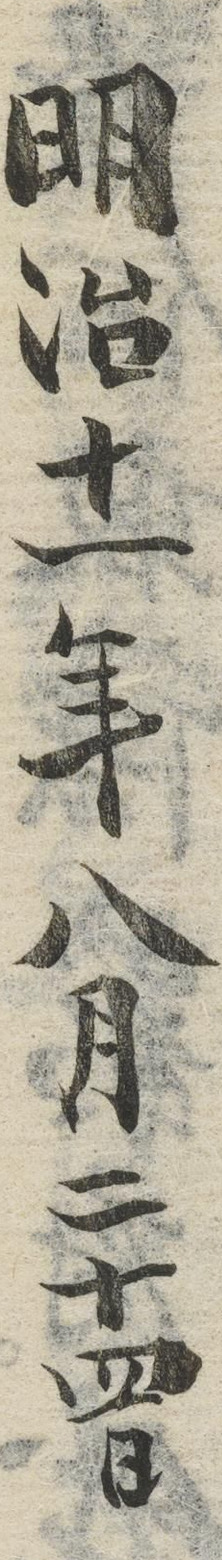明治十一年八月二十四百
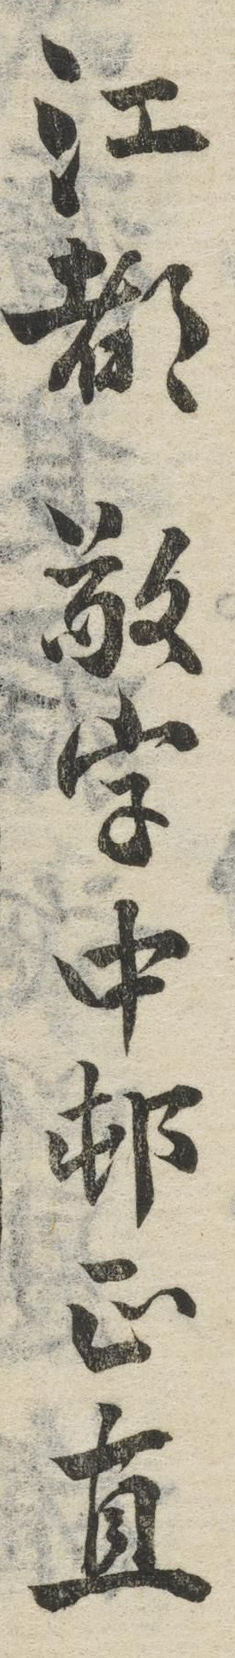江都敬宇中邨正直

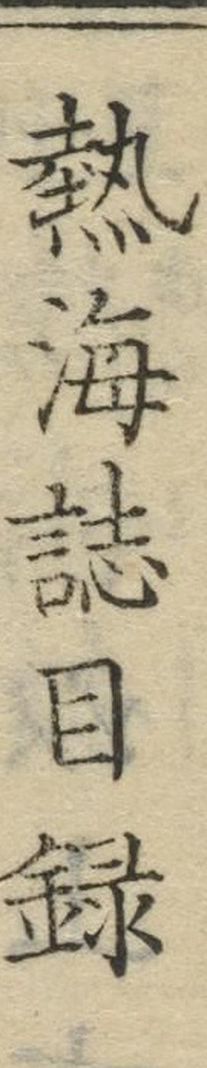熱海誌目録
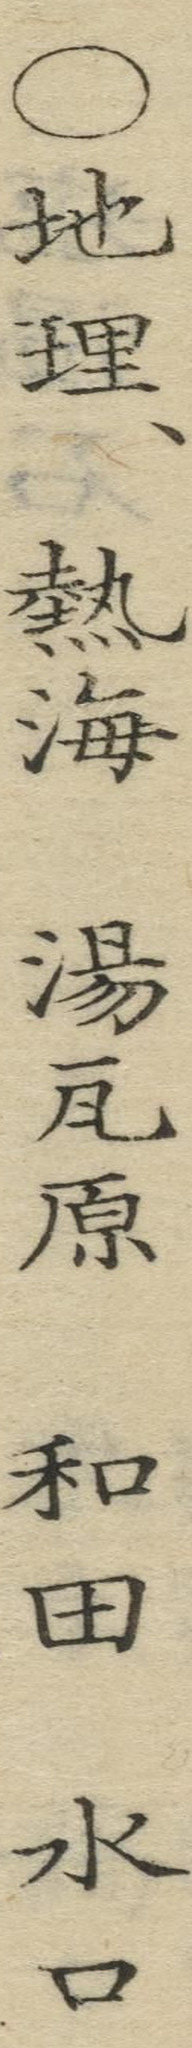○地理、熱海、湯瓦原和田水口
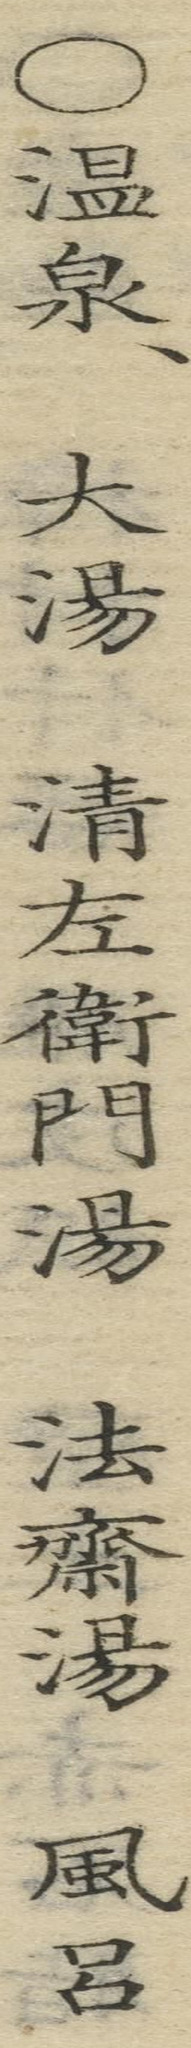○温泉、大湯清左衛門湯法斎湯風呂
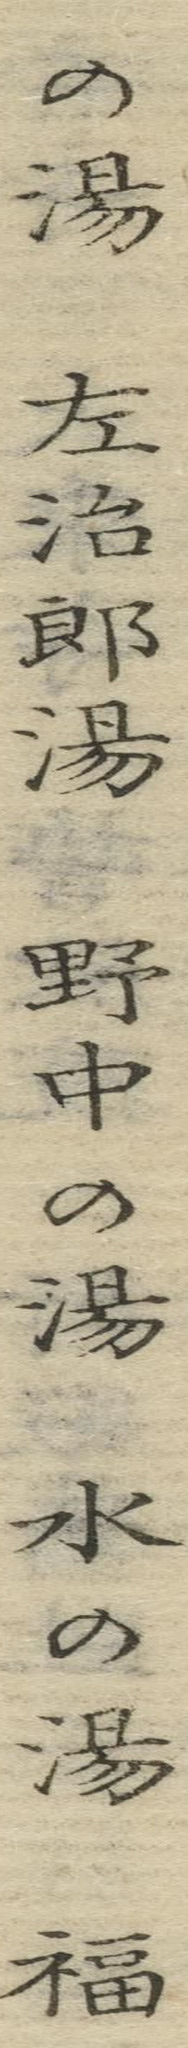の湯佐治郎湯野中の湯水の湯福
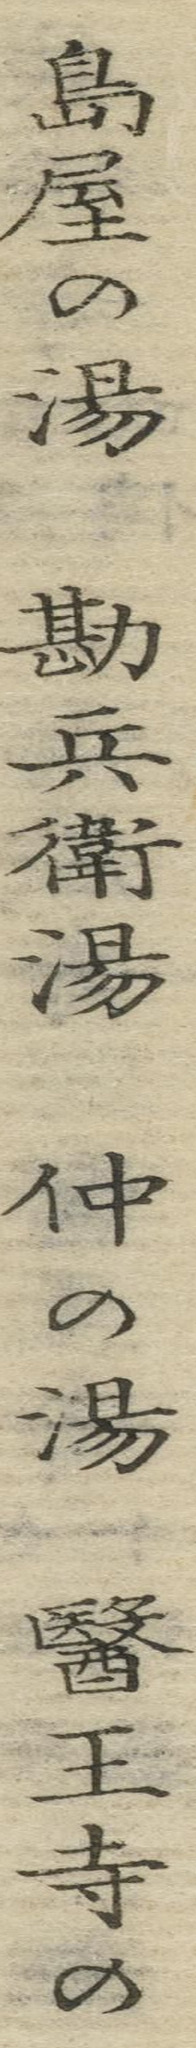島屋の湯勘兵衛湯仲の湯医王寺の
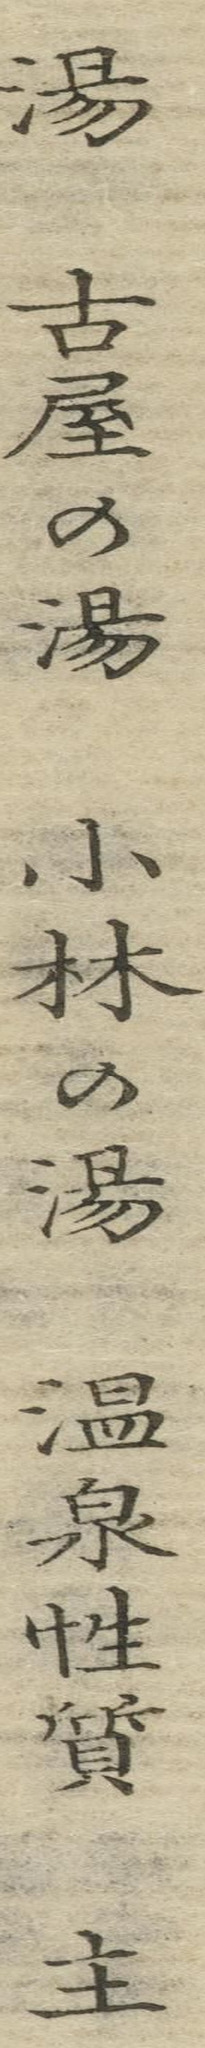湯古屋の湯小林の湯温泉性質主
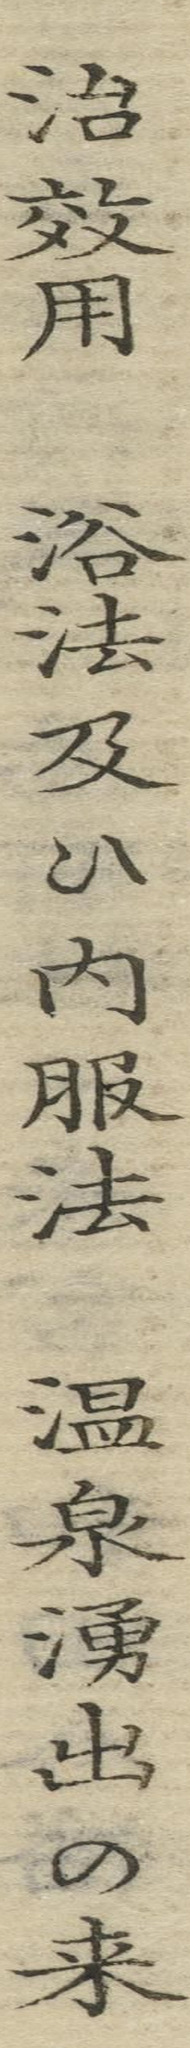治効用浴法及ひ内服法温泉湧出の来
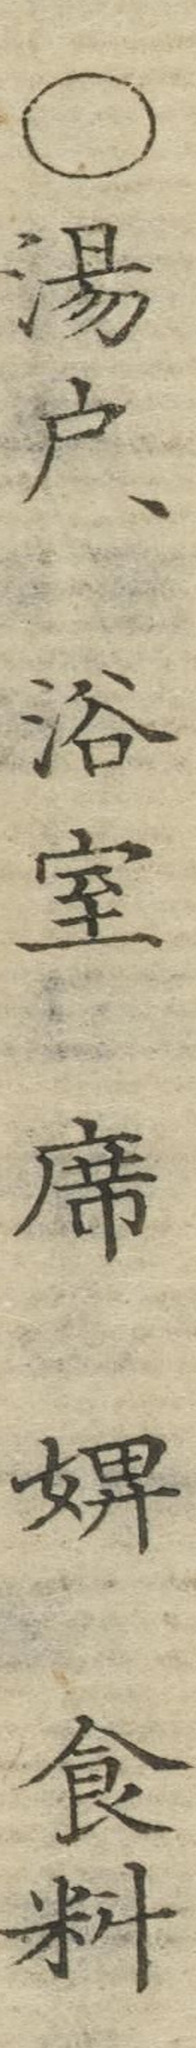○湯戸、浴室席婢食料

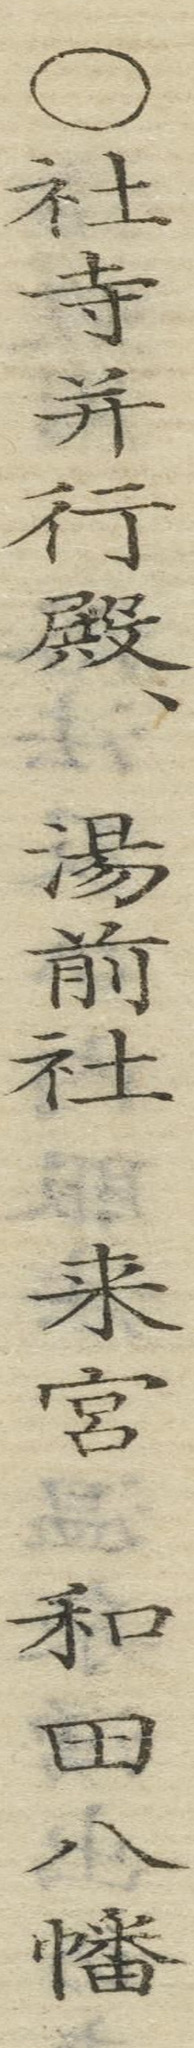○社寺并行殿、湯前社来宮和田八幡
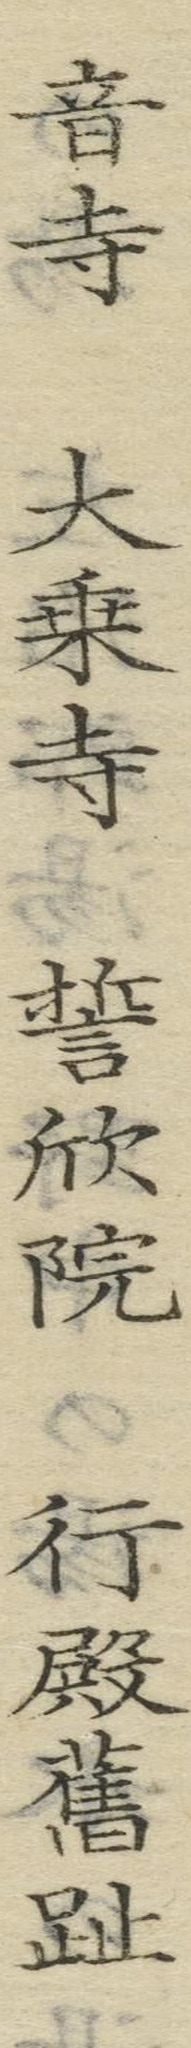音寺大乗寺誓欣院行伝旧趾
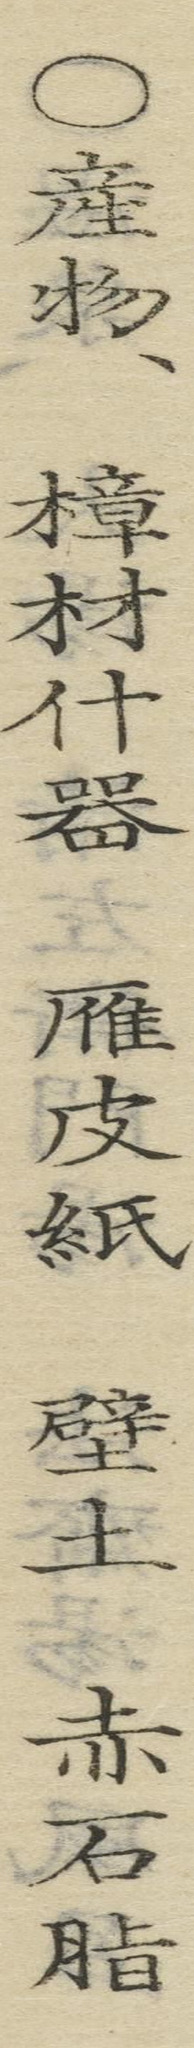○産物、樟材什器雁皮紙壁土赤石脂
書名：豆州熱海誌　完
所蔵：東京大学地震研究所図書室 Earthquake Research Institute Library, The University of Tokyo, JAPAN
